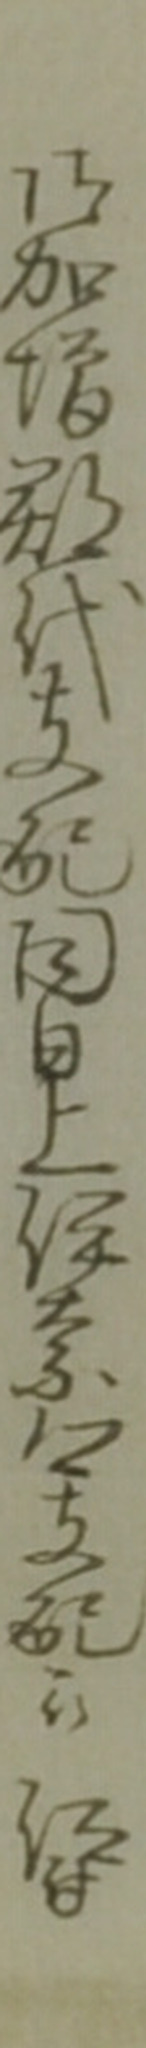御加増郡代支配同日上伊奈郷支配被仰付
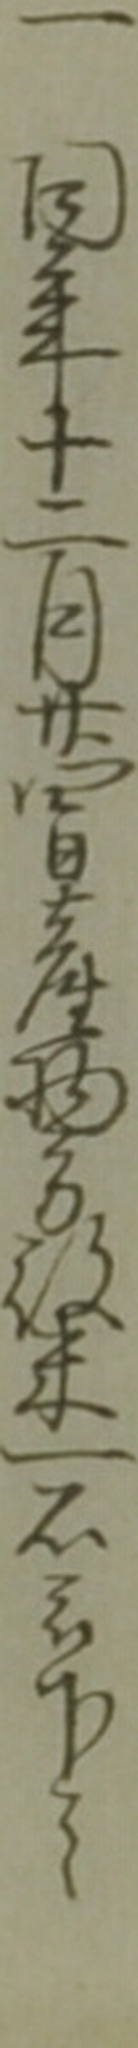一同年十二月廿四日産物方役米一石被下之
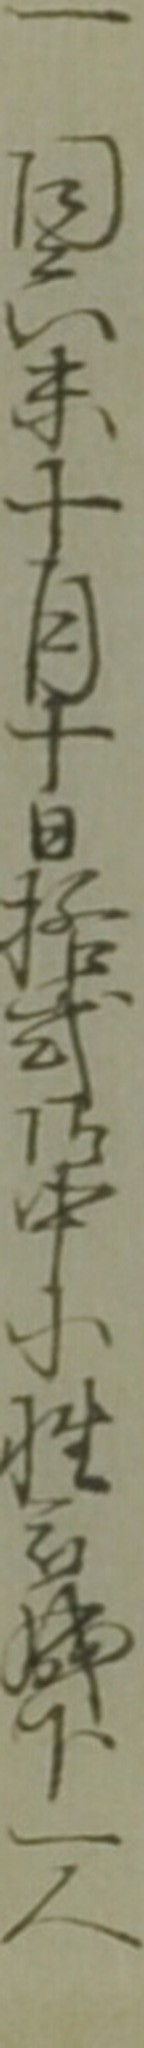一同六巳十月十日格式御中小性被成下一人
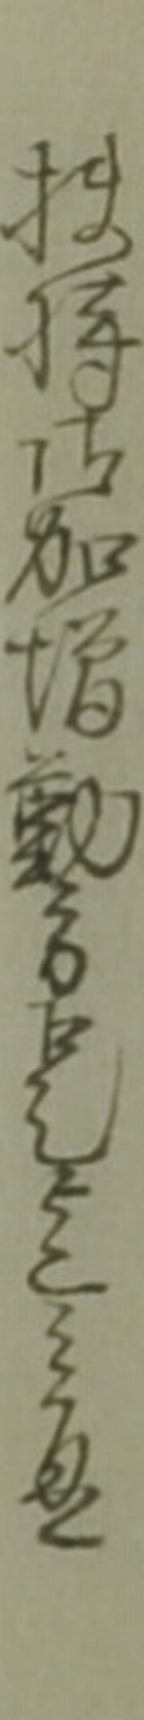扶持御加増勤方是迄之通
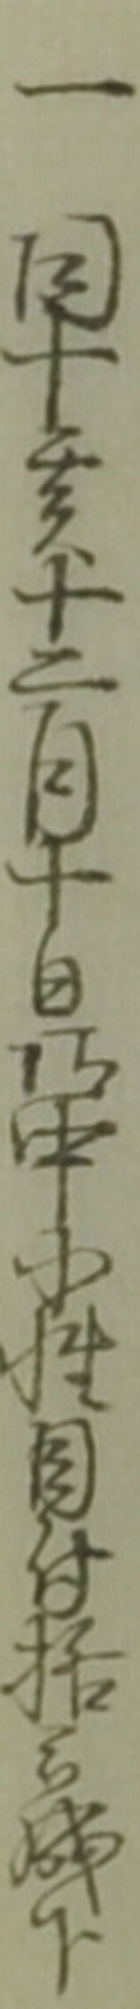一同十亥十二月十日御中小性目付格被成下
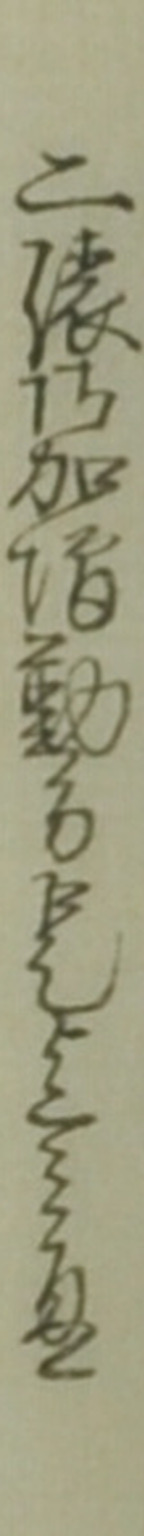二俵御加増勤方是迄之通

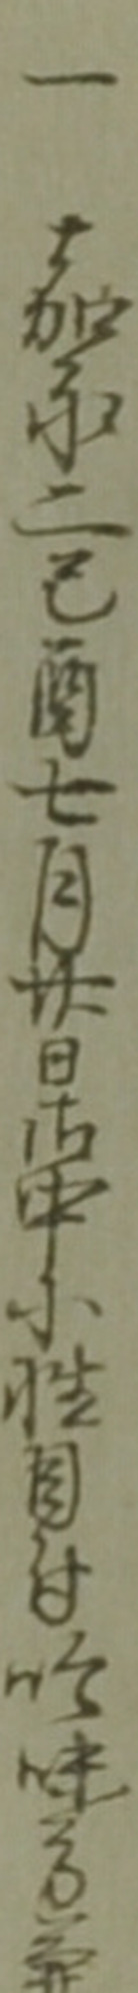一嘉永二己酉七月廿日御中小性目付吟味方兼
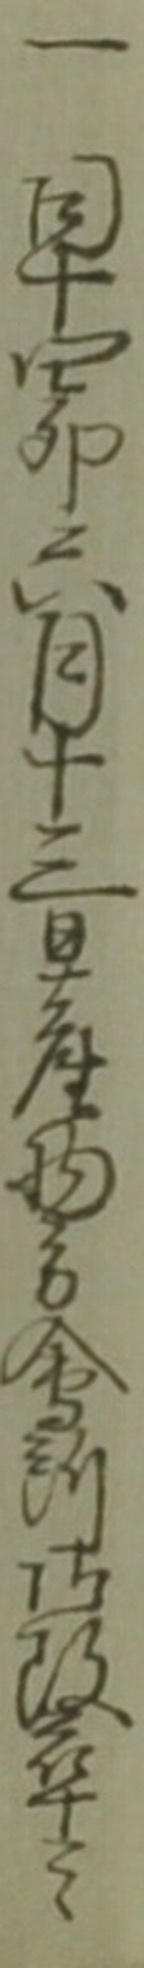一同十四卯六月十三日産物方会所御改革之
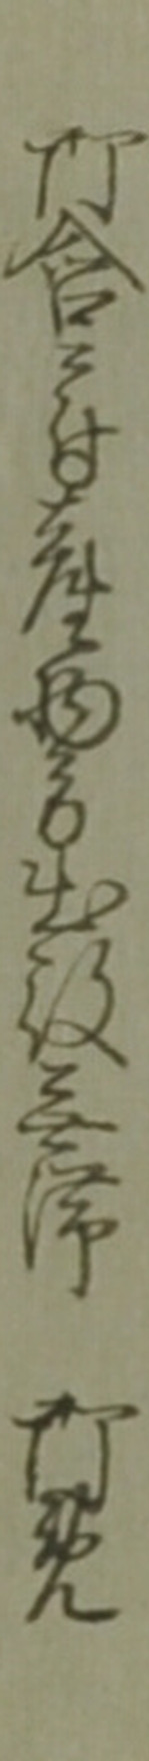御含ニ付産物方出役無滞御免
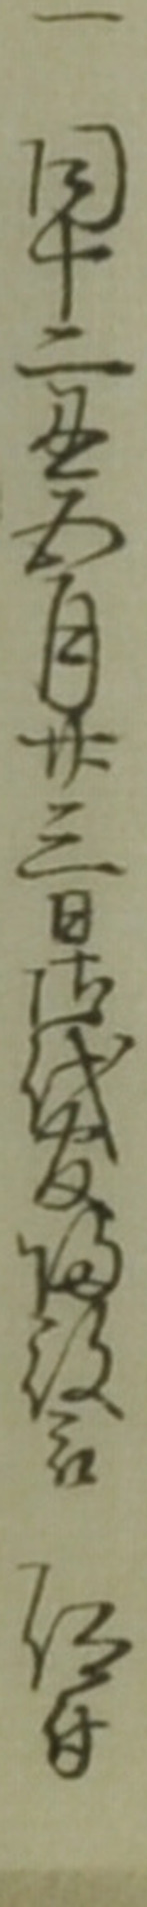一同十二丑五月廿三日御代官帰役被仰付
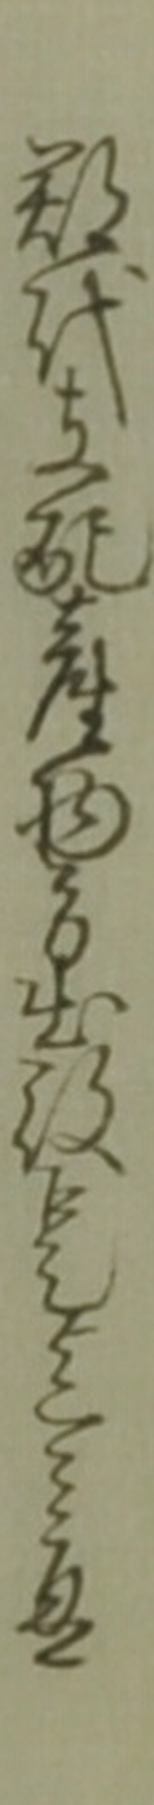郡代支配産物方出役是迄之通
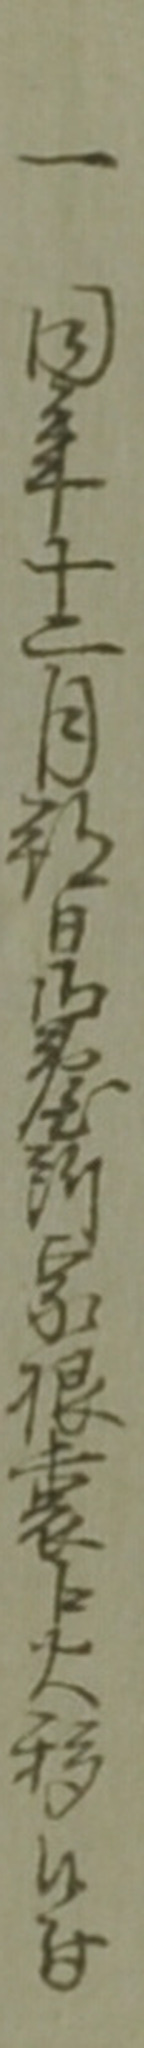一同年十二月朔日御台所家根裏江火移候付
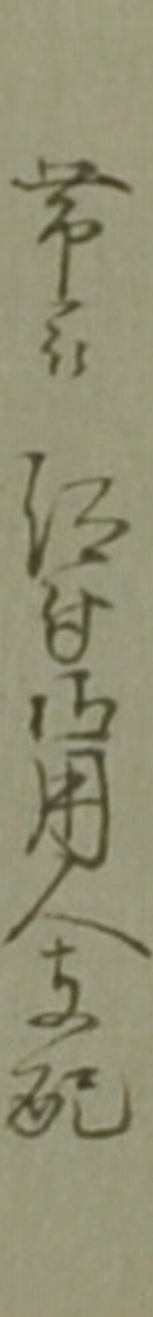帯被仰付御用人支配

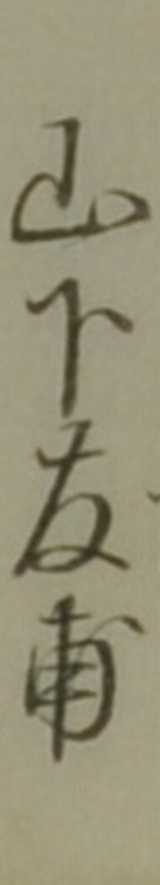山下友甫
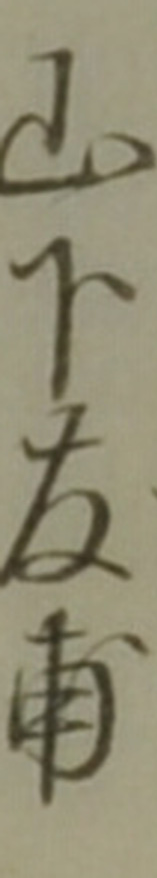山下友甫
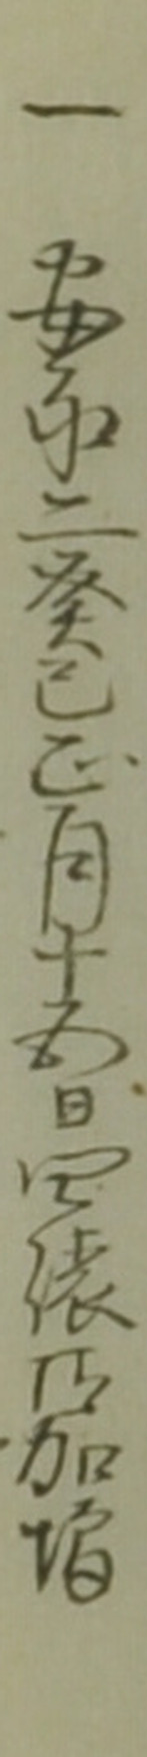一安永二癸巳正月十五日四俵御加増
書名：無足諸士勤仕録（二）
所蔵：伊那市立高遠町図書館・合同会社AMANE
